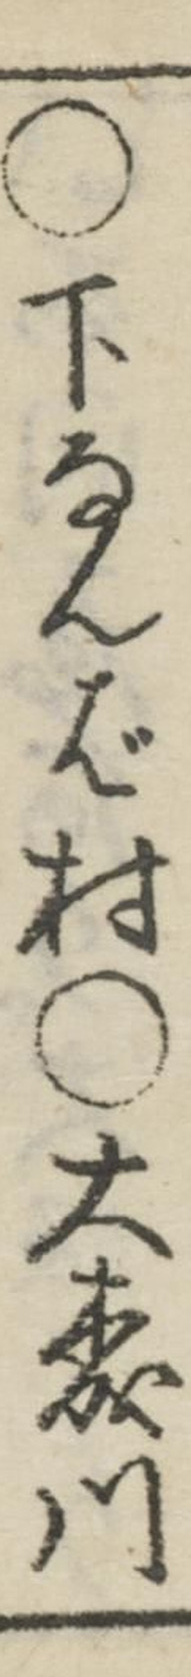○下なんば村○大森川
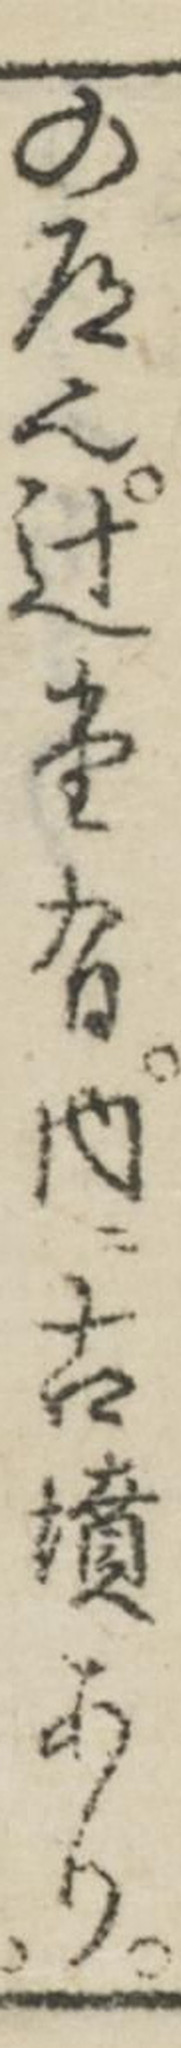の道也。辻堂有。内に古墳あり。
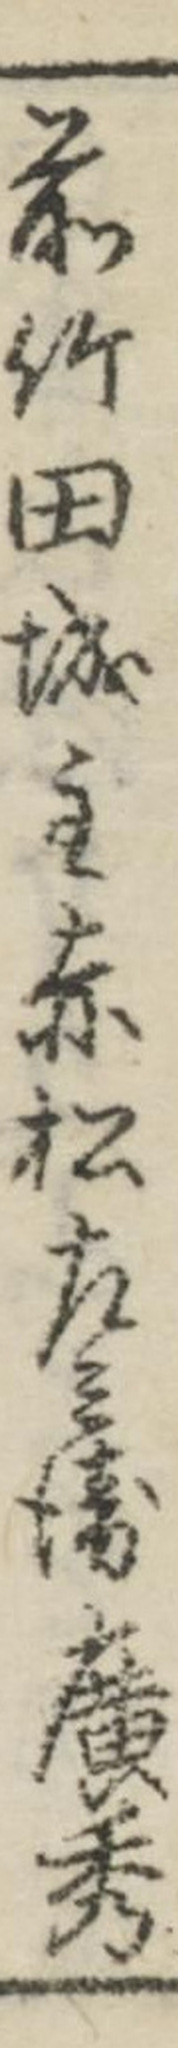前竹田城主赤松左兵衛広秀。
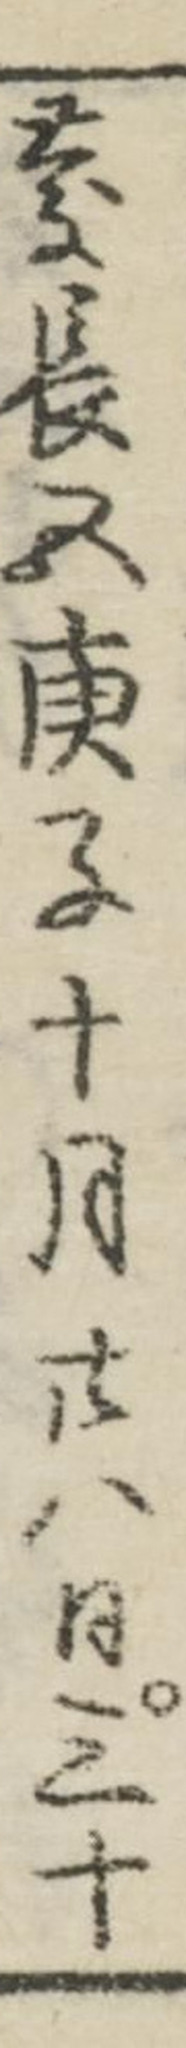慶長五庚子十月廿八日。三十
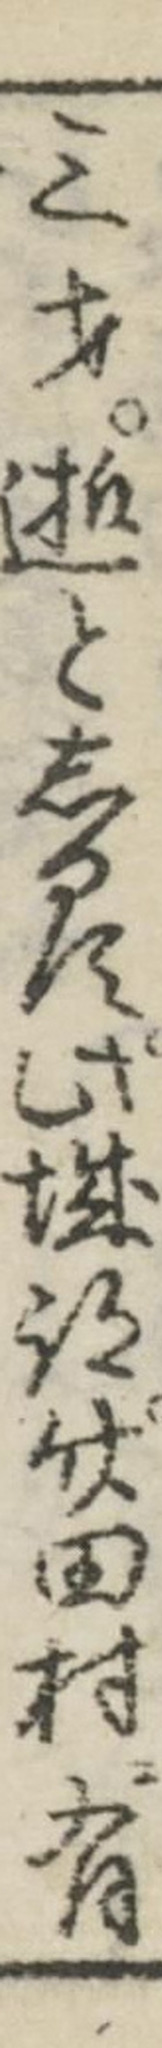三才。逝としるす。此城跡。竹田村に有
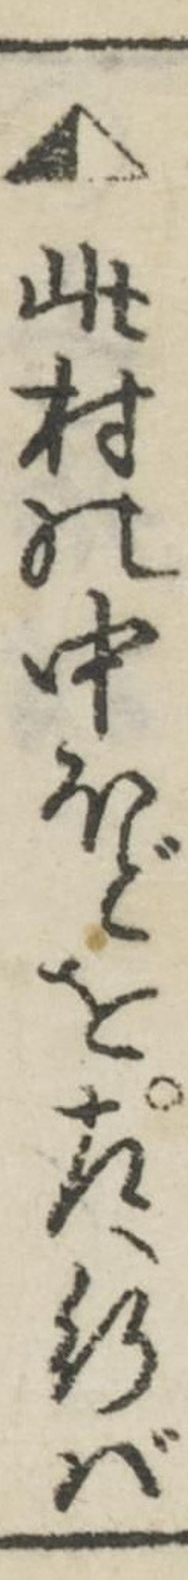▲此村の中ほどを。左へ行ば
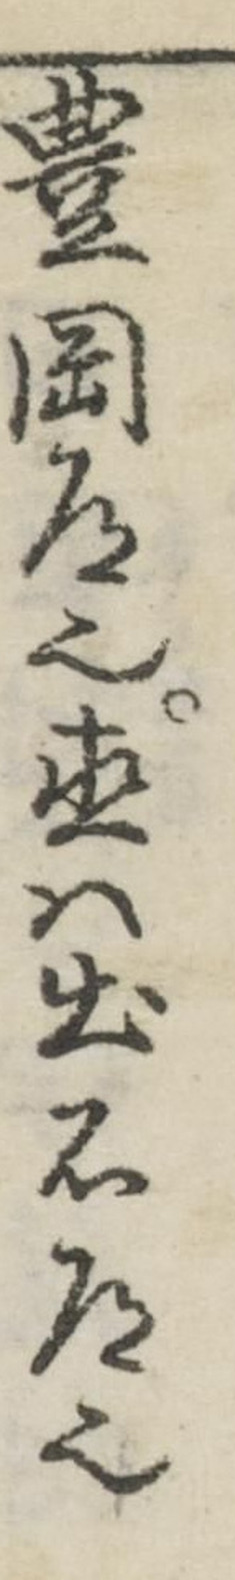豊岡道也。直は出石道也

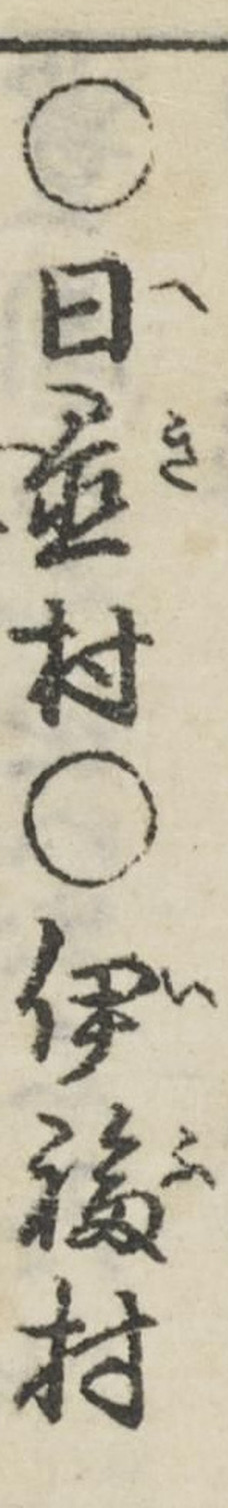○日置村○伊福村
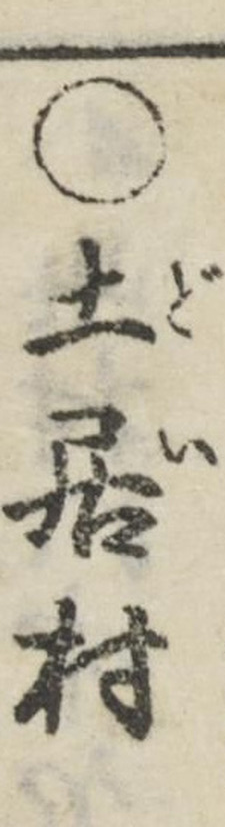○土居村
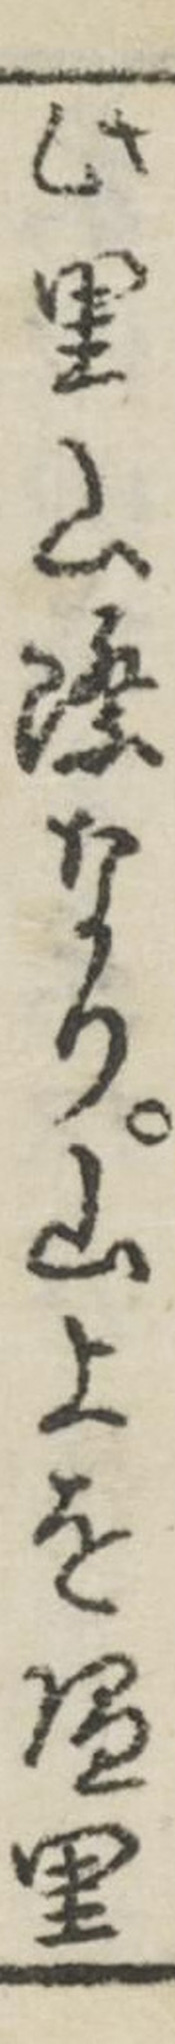此里山際なり。山上を隠里
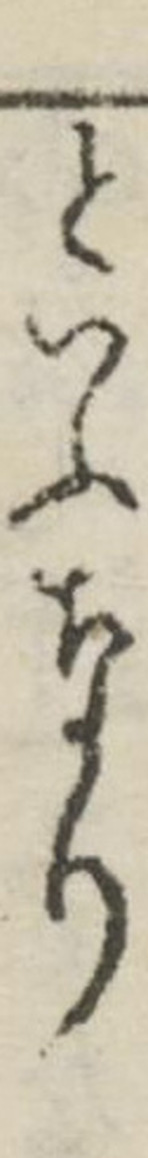といふなり
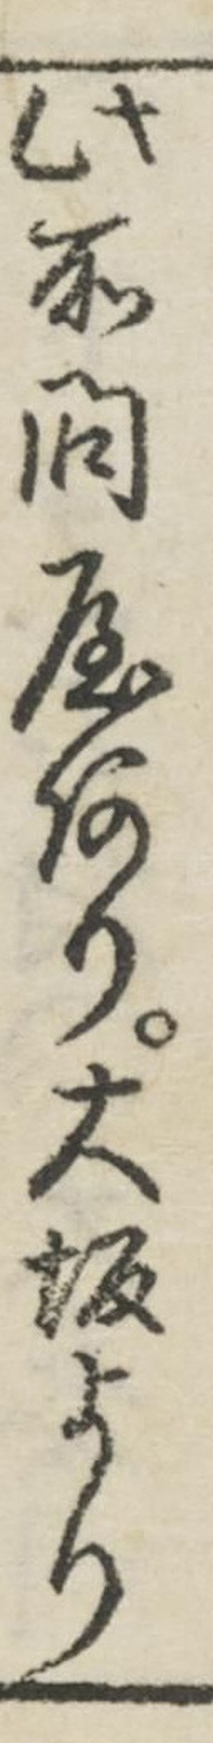此所問屋あり。大坂より
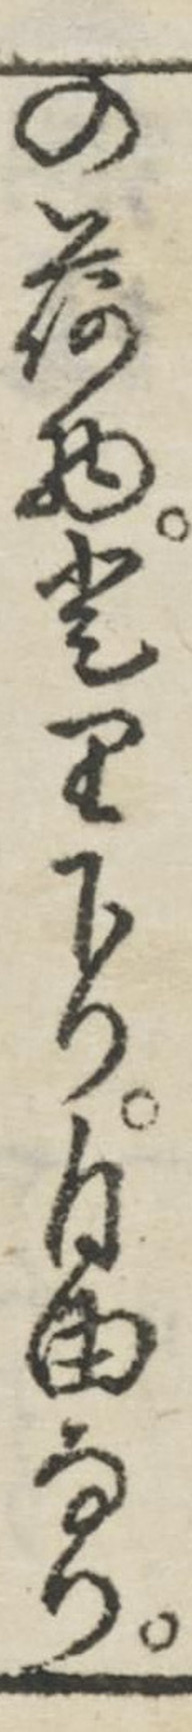の荷物。登り下り。自由なり。
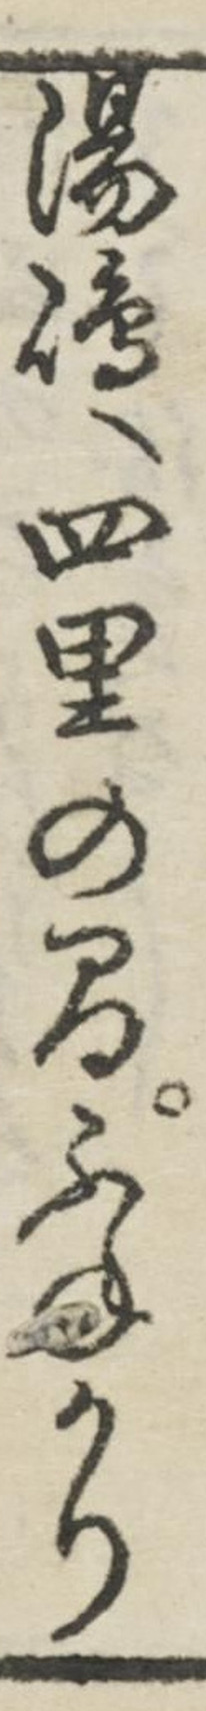湯嶋へ四里の間。ふねかり
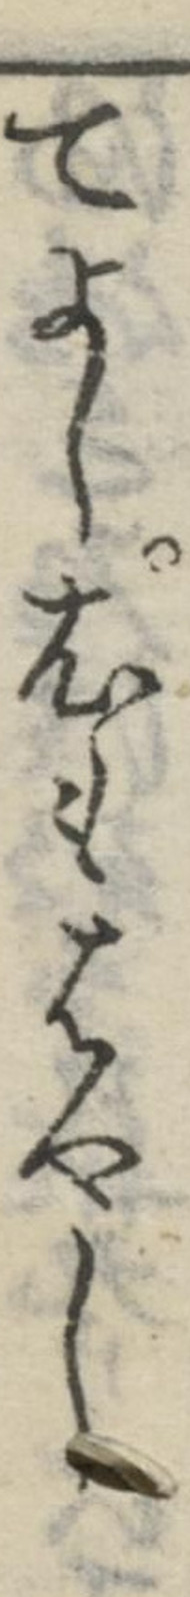てよし。尤もはやし
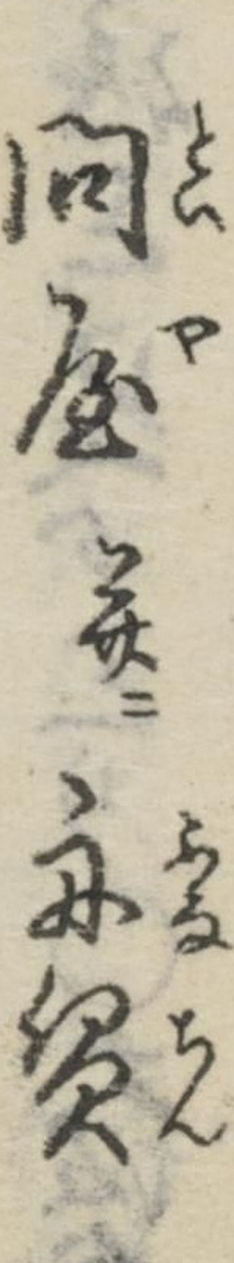問屋并に舟賃
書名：但州城崎浴湯辧
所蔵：東京大学地震研究所図書室 Earthquake Research Institute Library, The University of Tokyo, JAPAN
